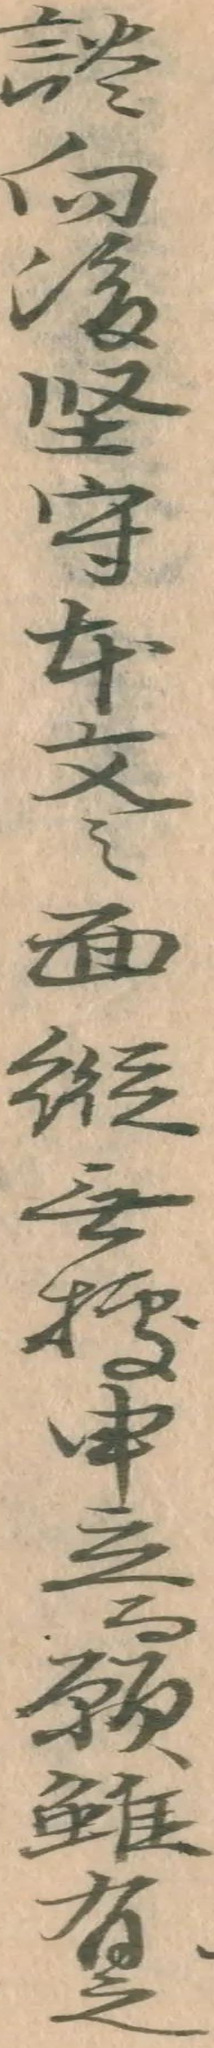談向後堅守本文之面縦無拠申立而願雖有之
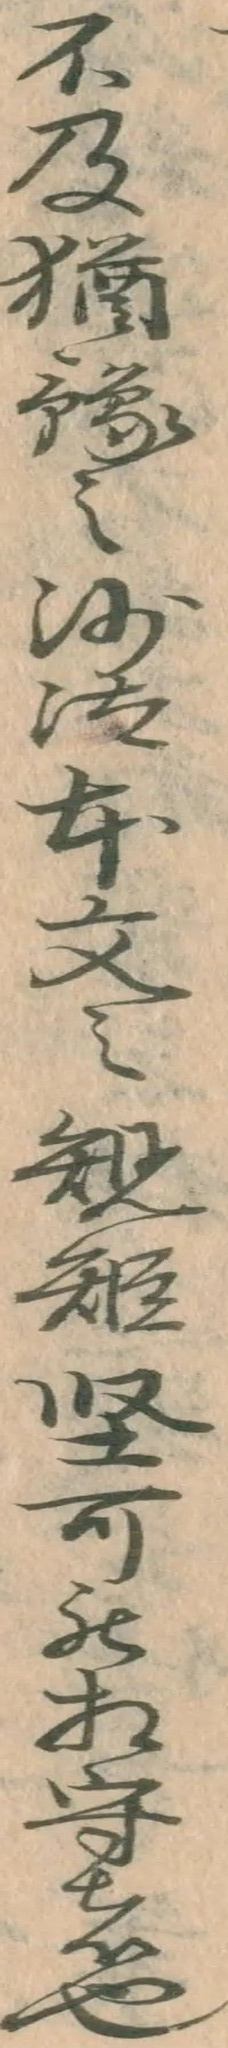不及猶予之沙汰本文之規矩堅可被相守者也
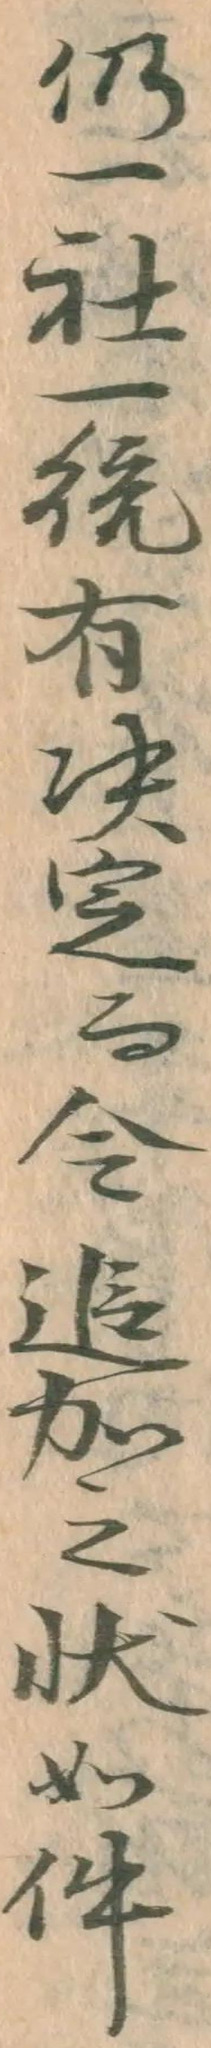仍一社一統有決定而令追加之状如件
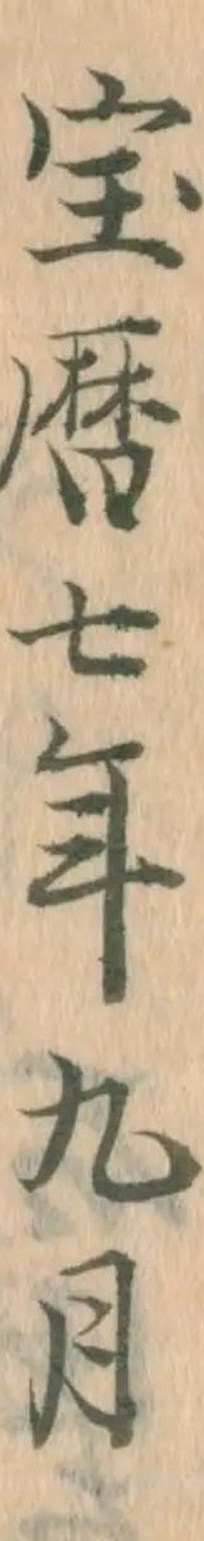宝暦七年九月
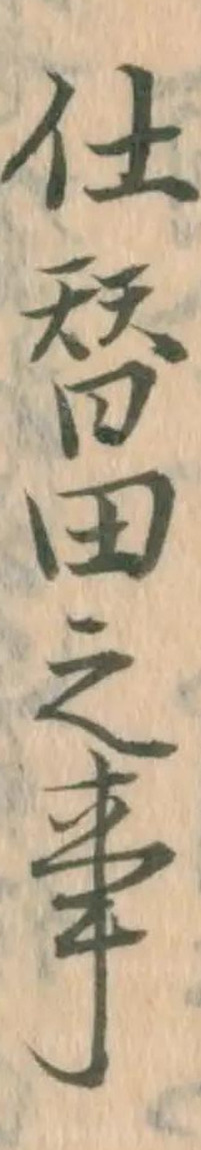仕替田之事
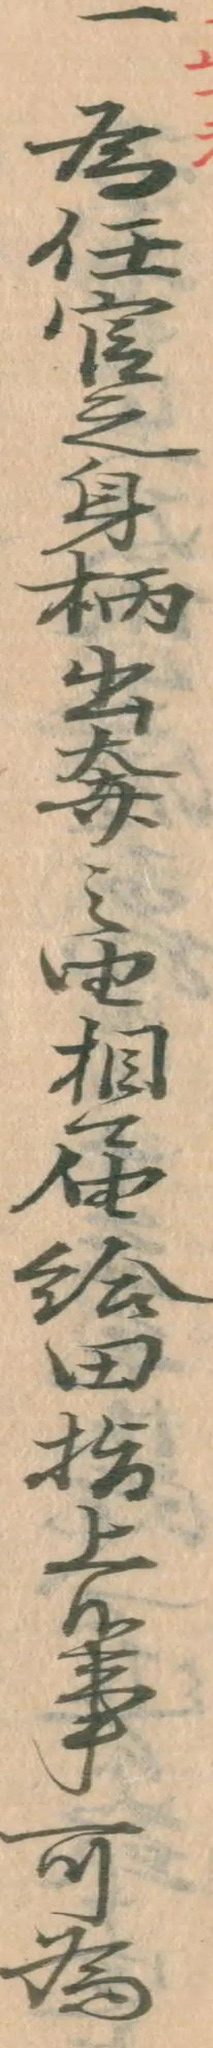一、為任官之身柄出奔之由相届給田指上候事可為
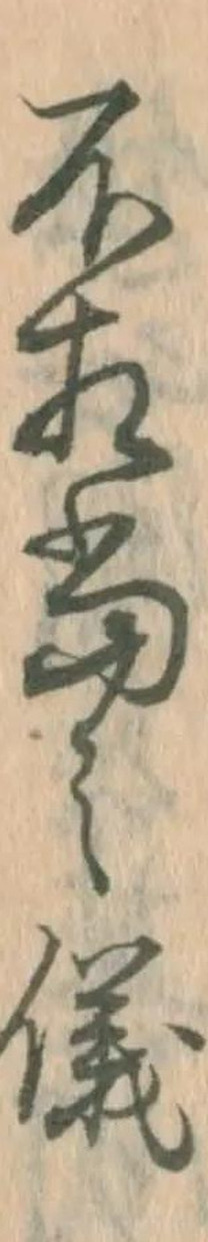不相當之儀
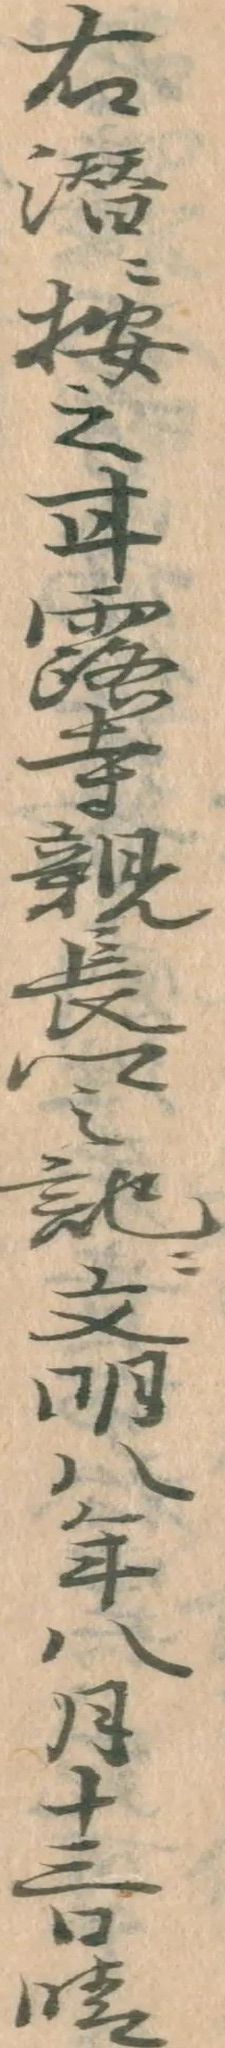右潜ニ按之甘露寺親長卿之記ニ文明八年八月十三日晴
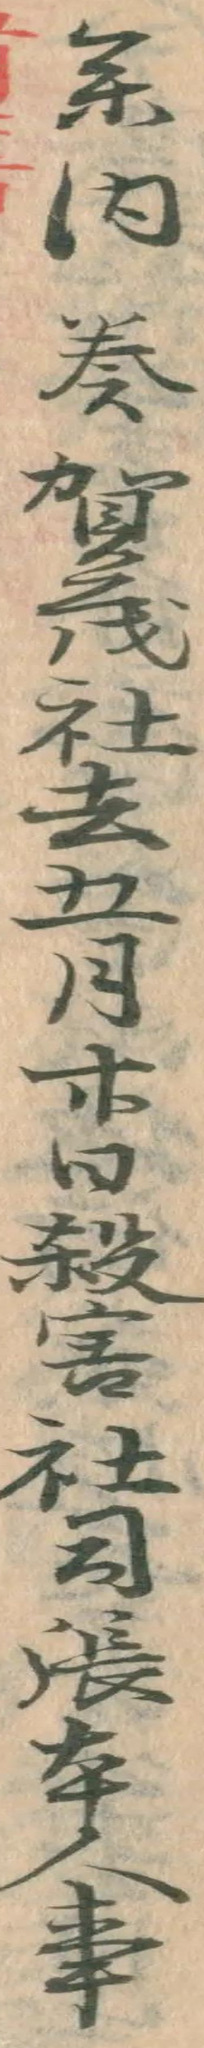参内奏賀茂社去五月廿日殺害社司張本人事
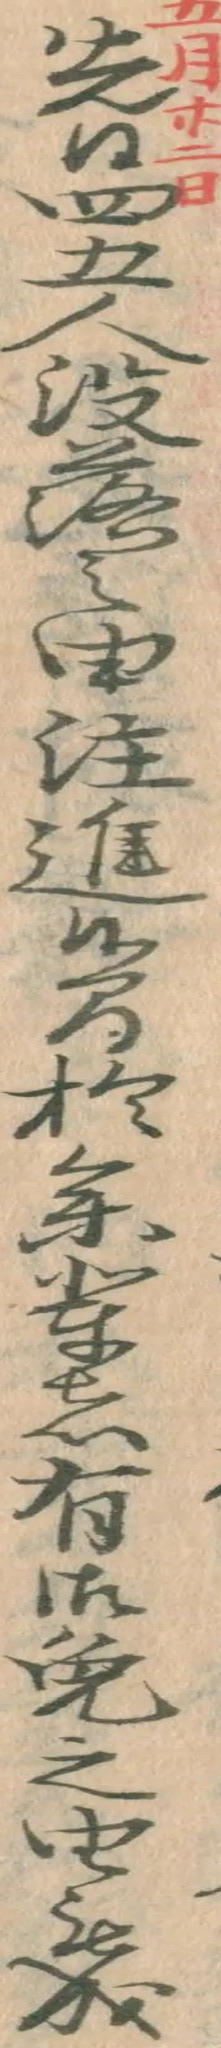先日四五人没落之由注進候間於参輩者有御免之由被成
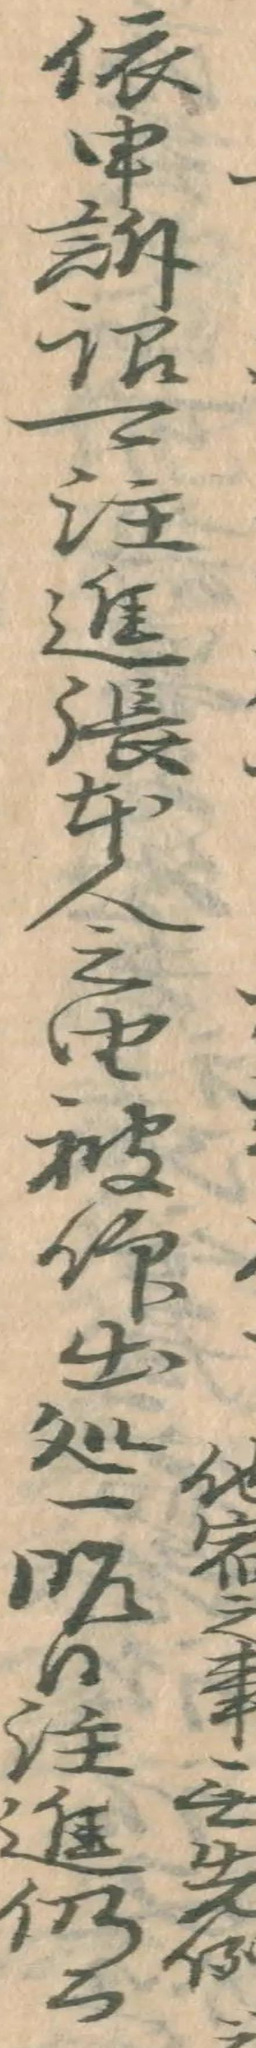依申訴詔可注進張本人之由被仰出処一昨日注進仍而
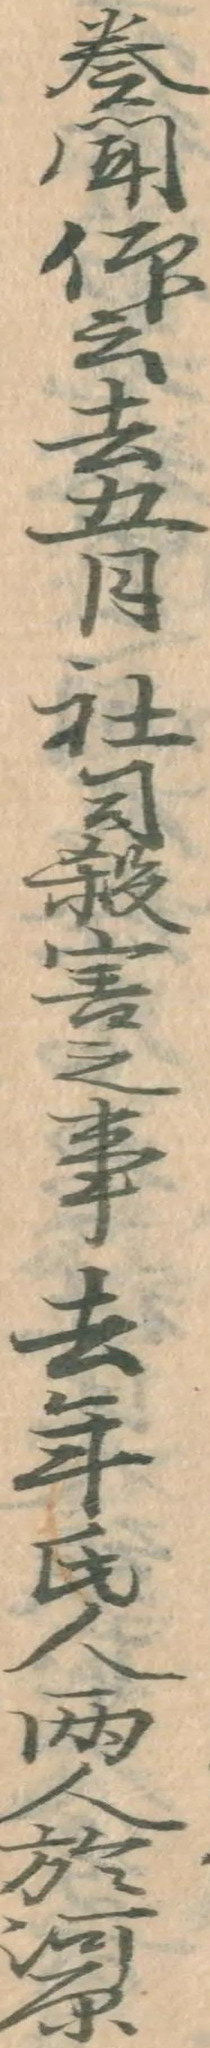奏聞仰云去五月社司殺害之事去年氏人両人於河原
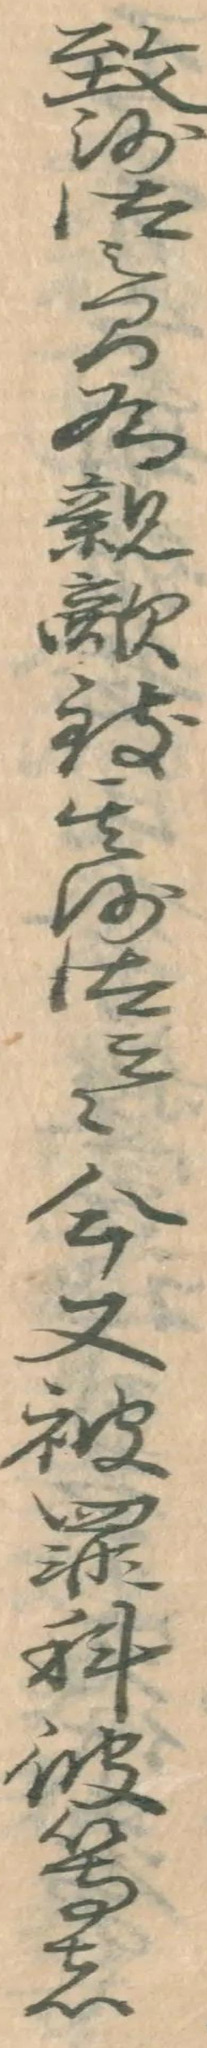致沙汰之間為親敵致其沙汰云々今又被罪科彼等者

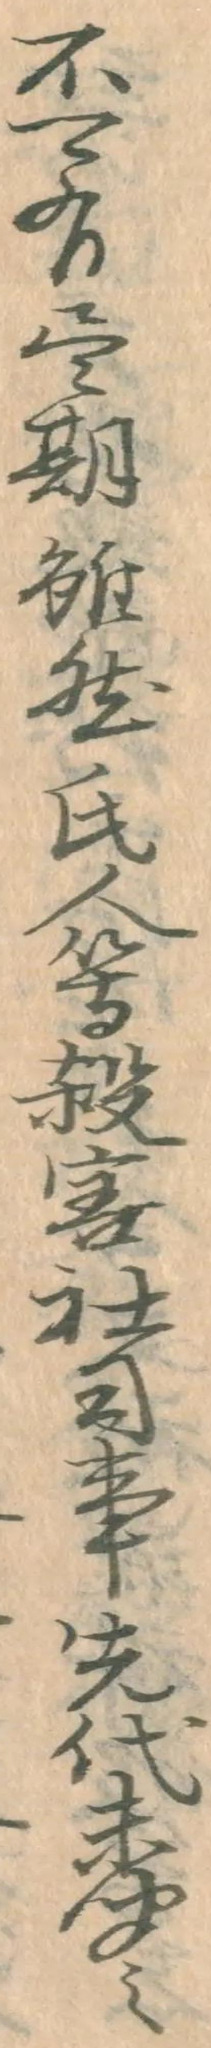不可有尽期雖然氏人等殺害社司事先代未聞之
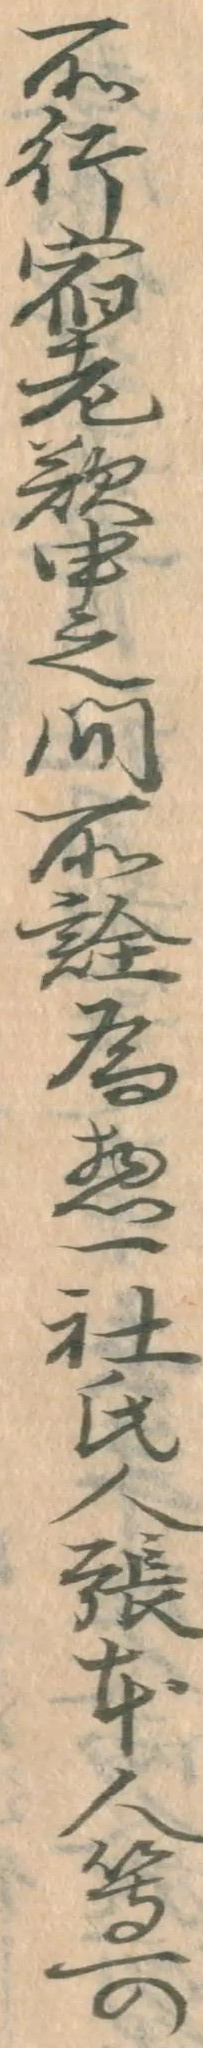所行宿老歎申之間所詮為惣一社氏人張本人等可
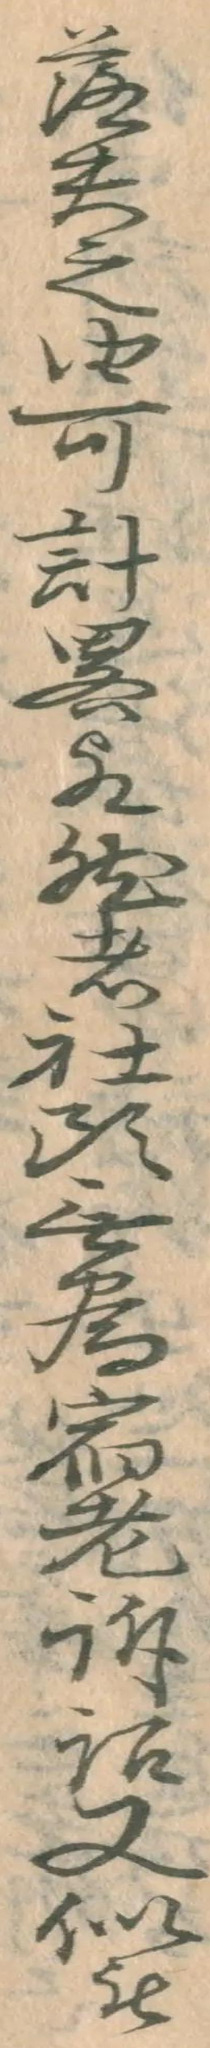落失之由可計略歟然者社頭無為宿老訴詔又似被
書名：賀茂社記録. 第39冊
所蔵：国立国会図書館 National Diet Library, JAPAN
